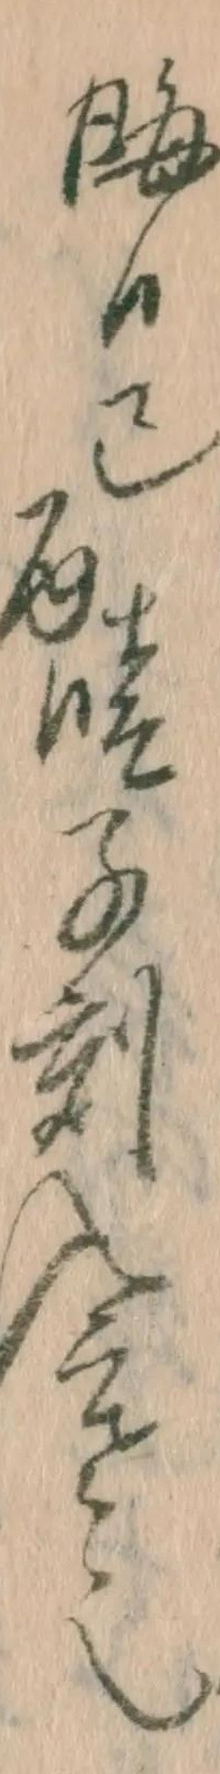晦日己酉晴子刻入寒也
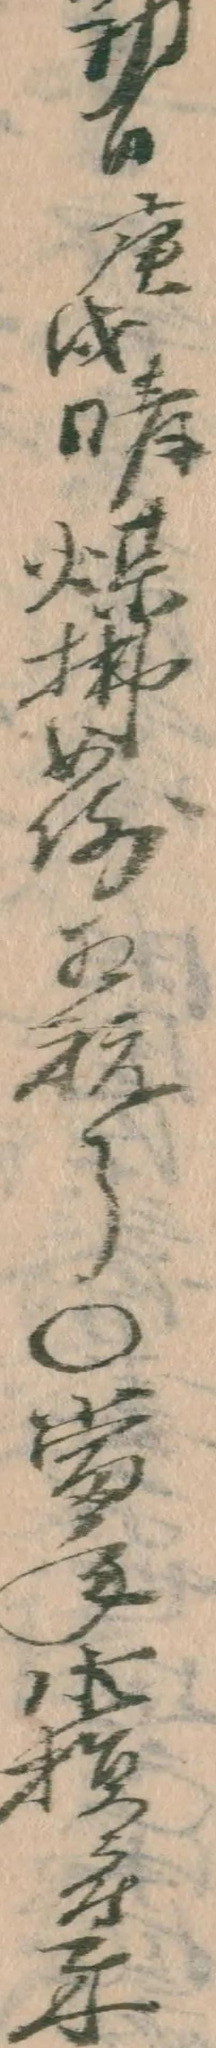朔日庚戌晴煤払如例相祝了〇當年水損ニ付来
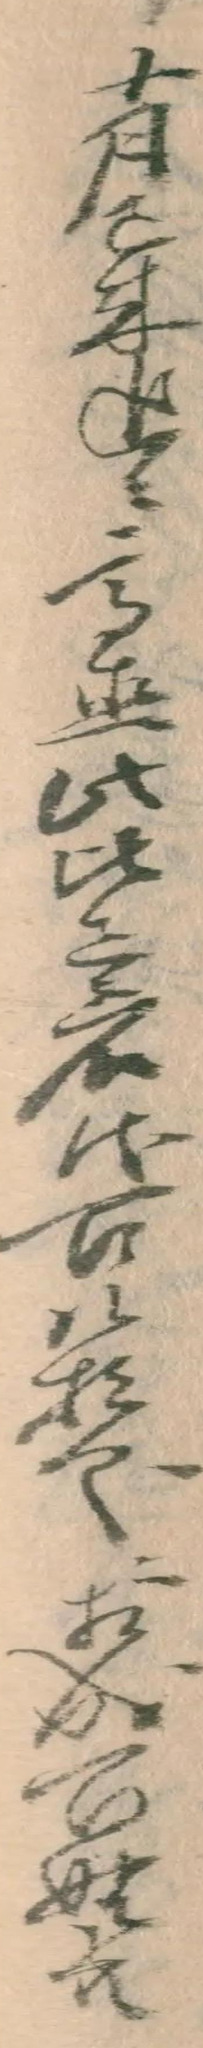十月已来追々高直此比壱石代百八拾匁ニ相成百姓共
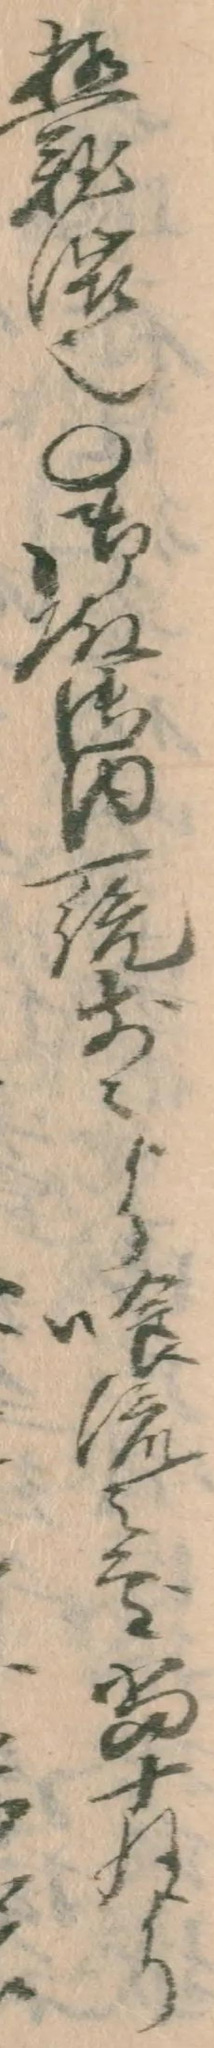極難渋也○御殿御内一統前々より喰流之處當十月より
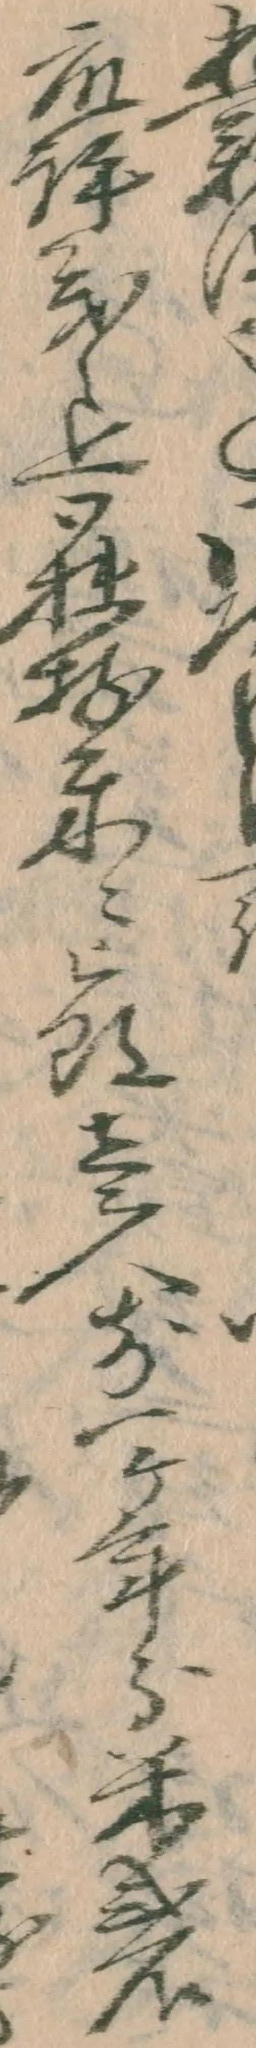衆評義之上御扶持米ニ被改壱人前一ヶ年分米弐石
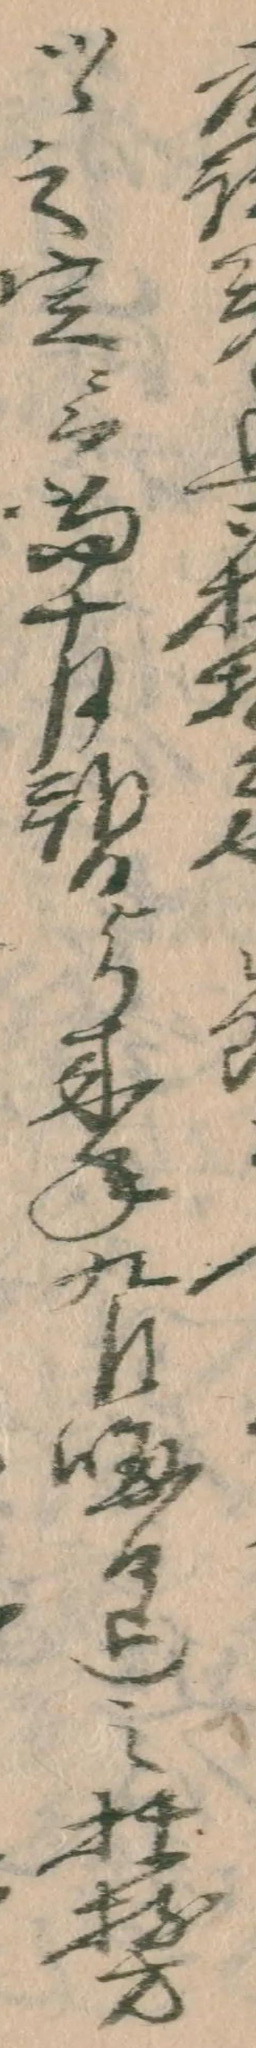ツヽ之定ニ而當十月朔日より来年九月晦日迄之扶持方
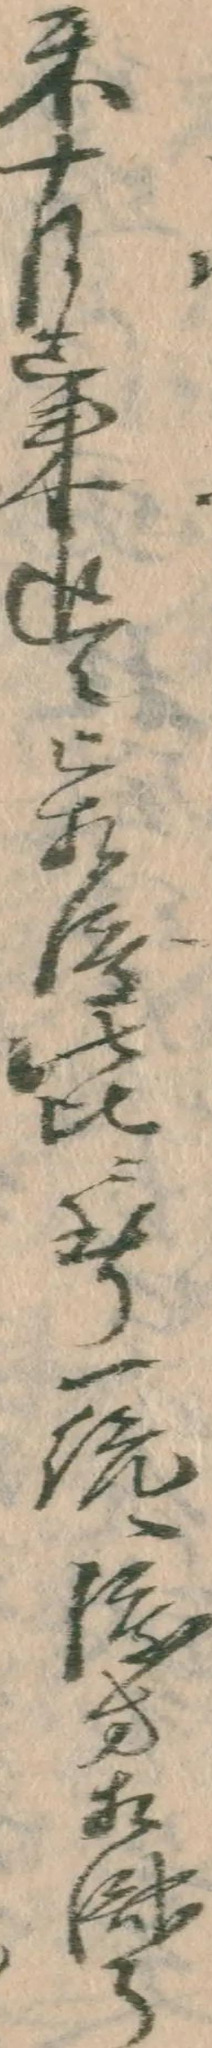来十月已来追〻被相渡此比二至り一統へ渡方相済了
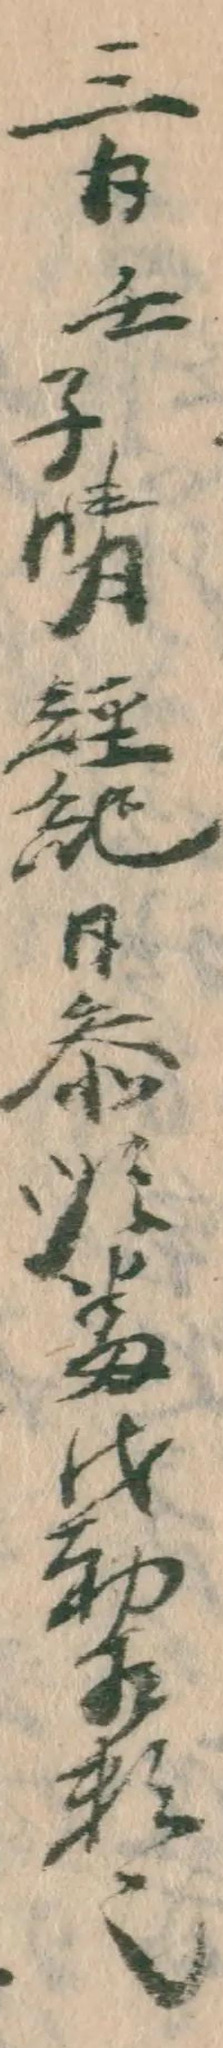三日壬子晴経紀日参順番代勤相頼也
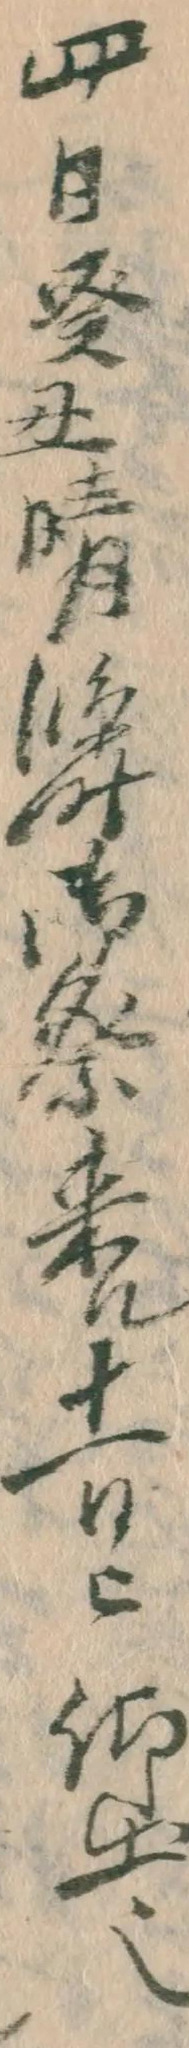四日癸丑晴臨時御祭来ル十一日被仰出也
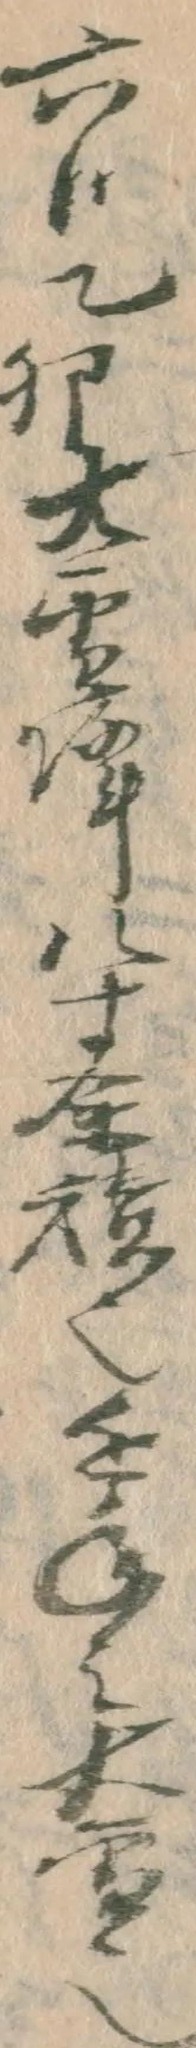六日乙卯大雪降八寸余積也近年之大雪也
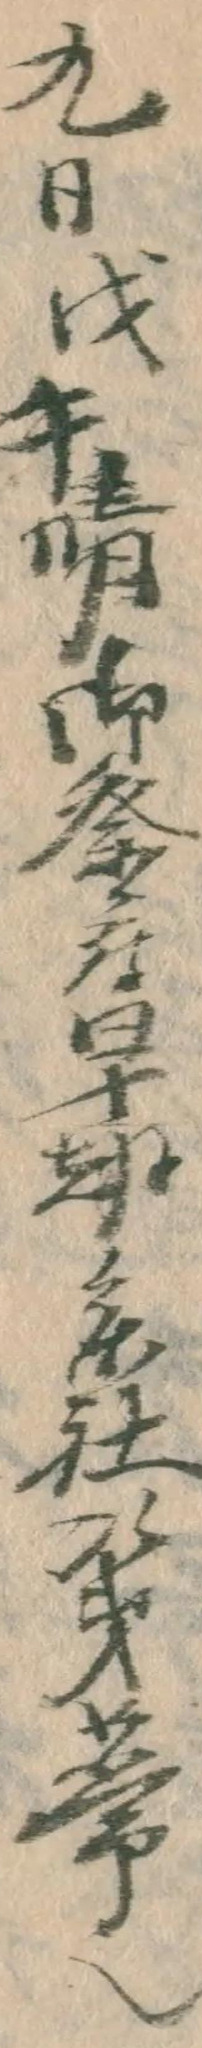九日戊午晴御参ニ付早朝参社次第如常也
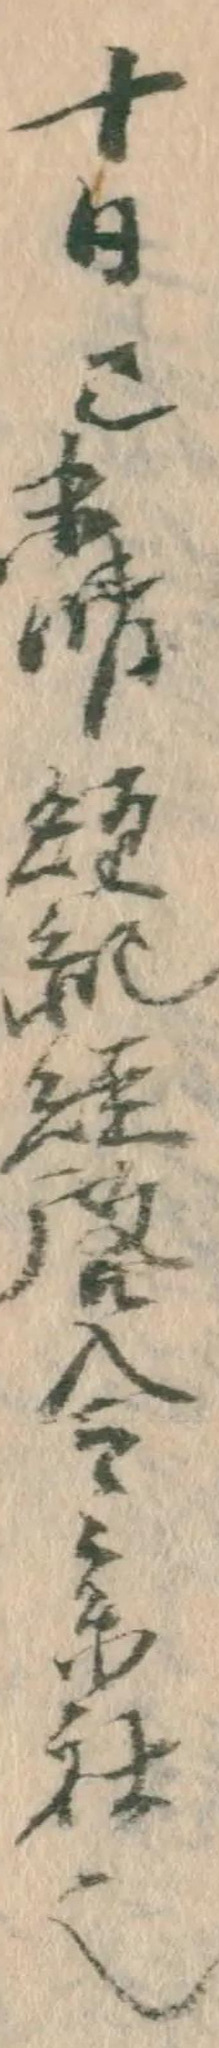十日己末晴経紀経啓令参社也
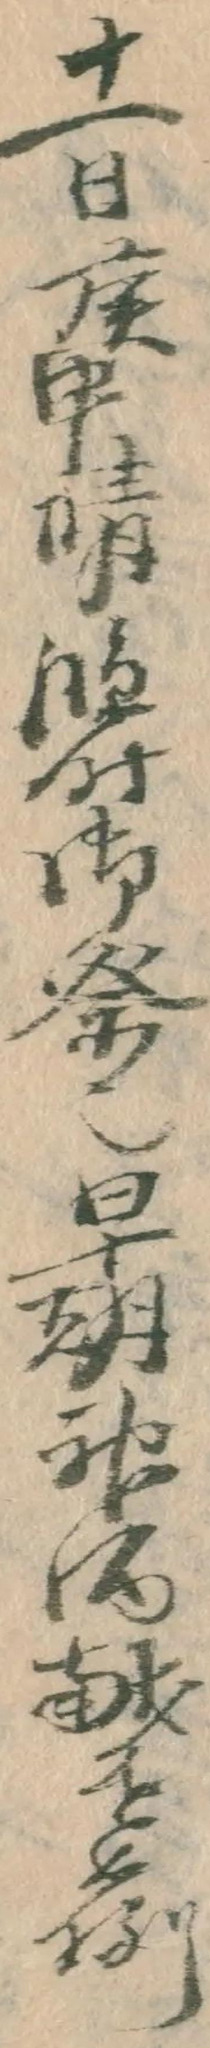十一日庚申晴臨時御祭也早朝神酒献進如例
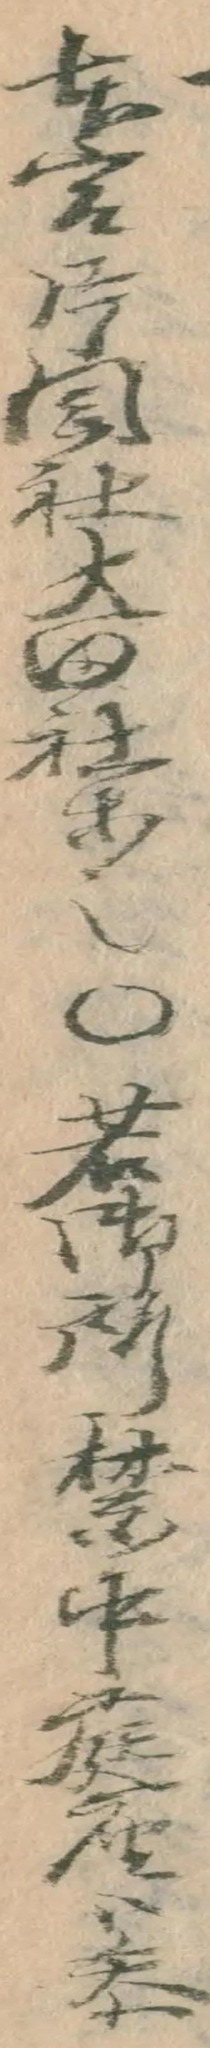本宮片岡社大田社少也○若御所禁中庭座御参

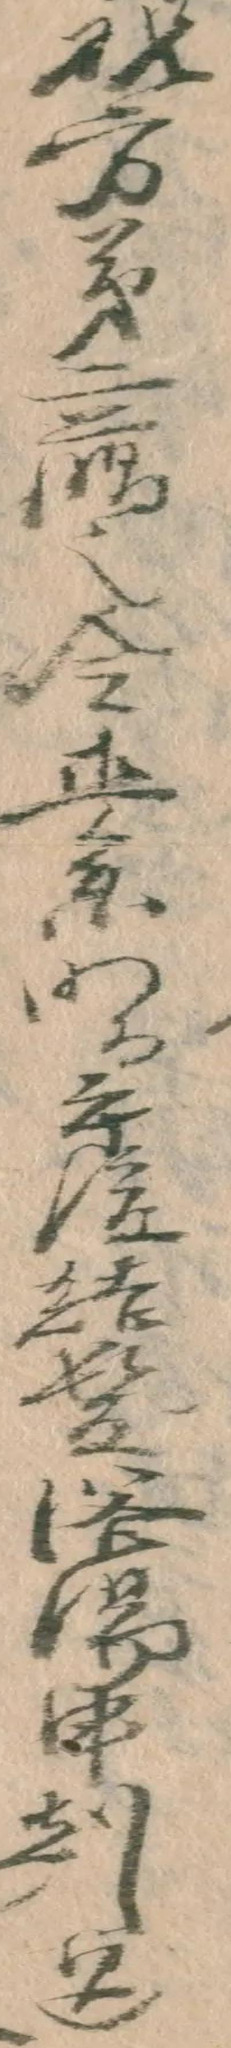祝方第二臈也令直参仍而平縒結髪浴湯申刻過
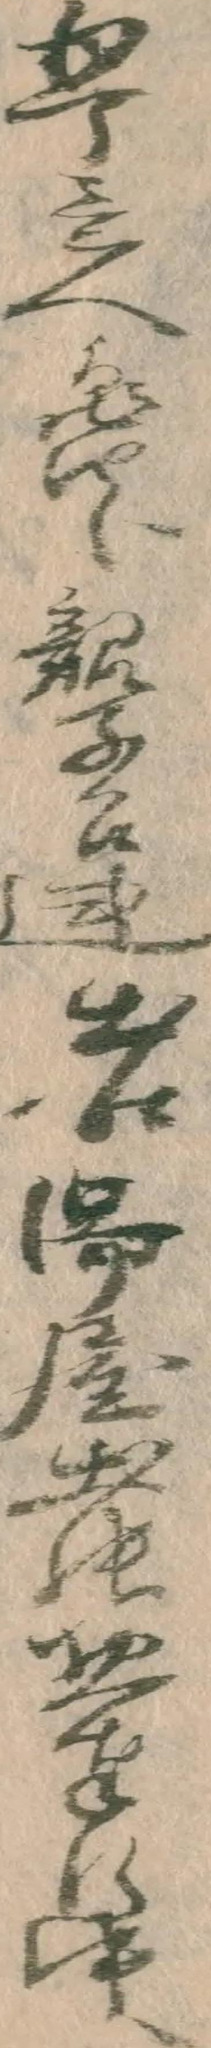白丁壱人亀四郎親子召連出仕湯屋出張惣奉行中へ
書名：賀茂社記録. 第67冊
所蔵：国立国会図書館 National Diet Library, JAPAN
